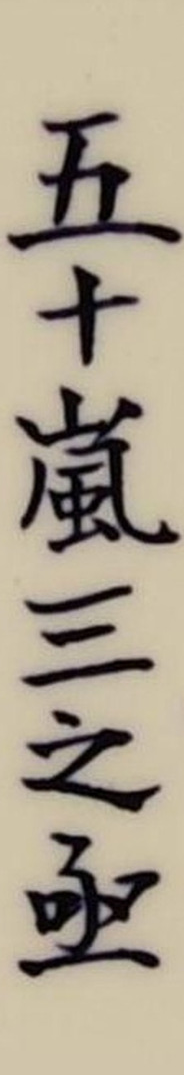五十嵐三之丞
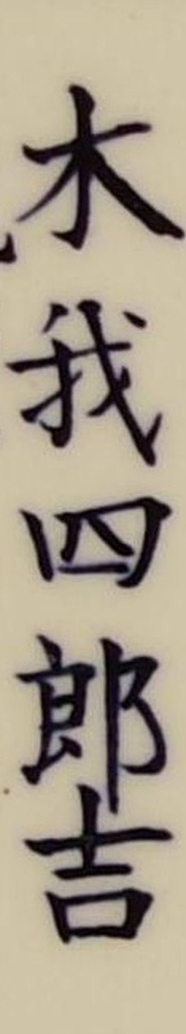木我四郎吉
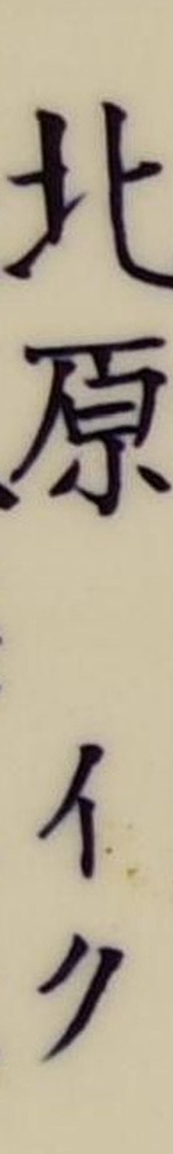北原イク
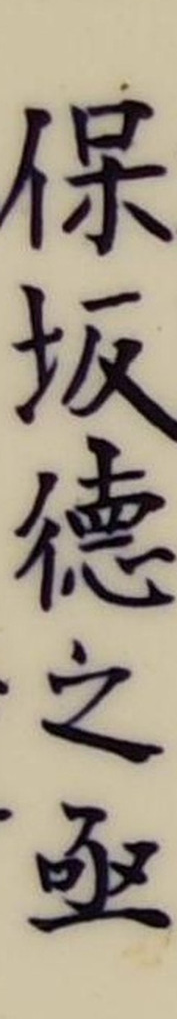保坂徳之丞
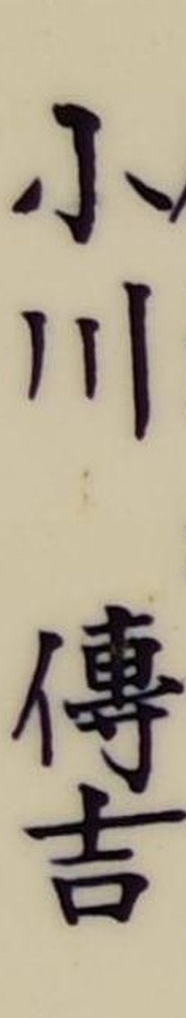小川傳吉
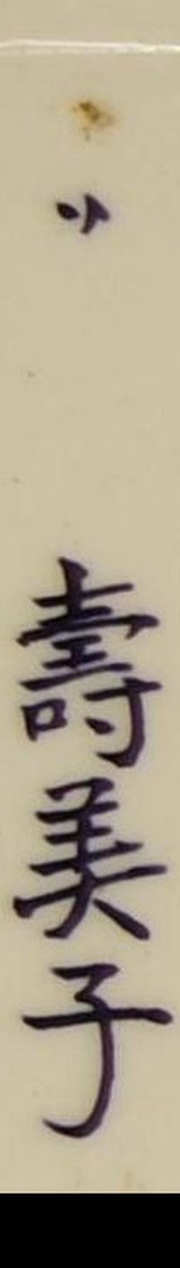寿美子
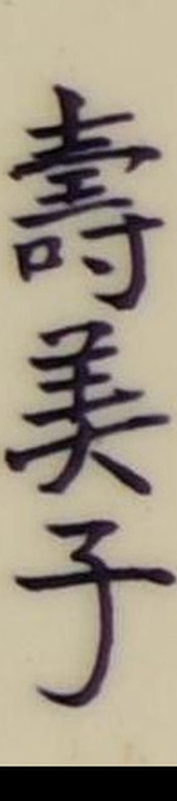寿美子

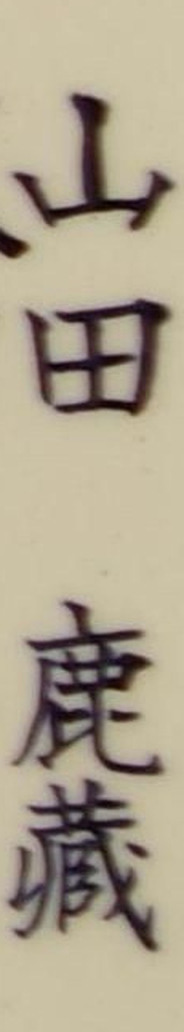山田鹿蔵
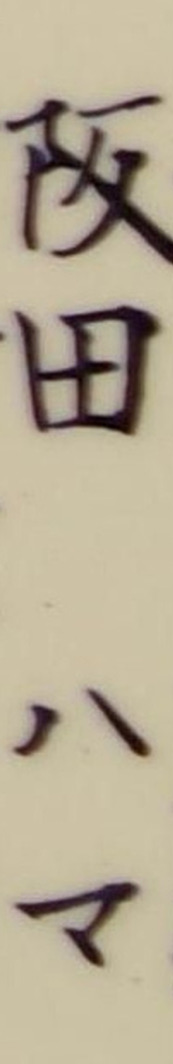阪田ハマ
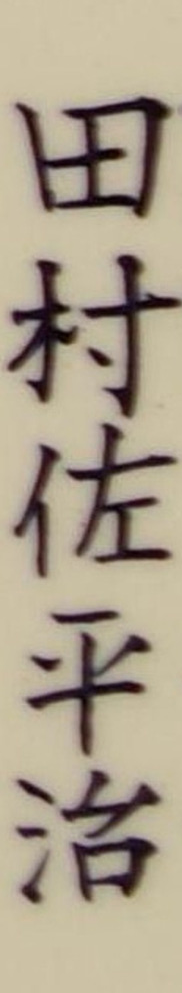田村佐平治
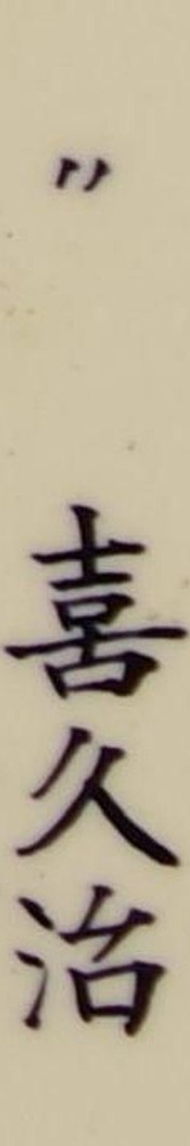喜久治
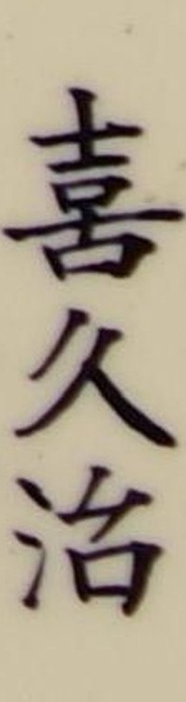喜久治
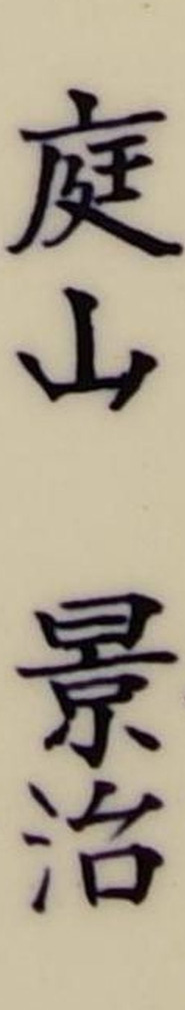庭山景治
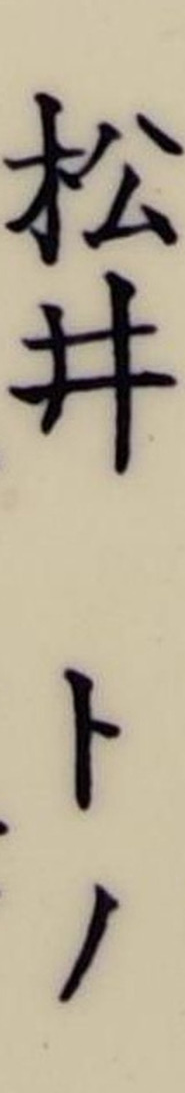松井トノ
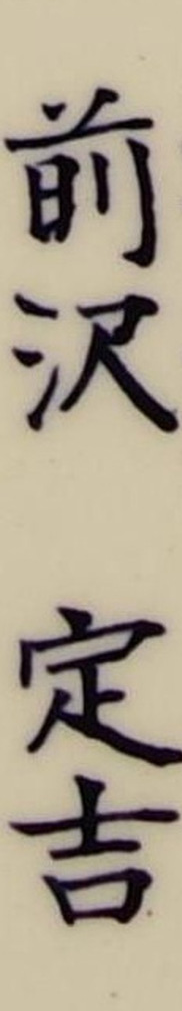前沢定吉
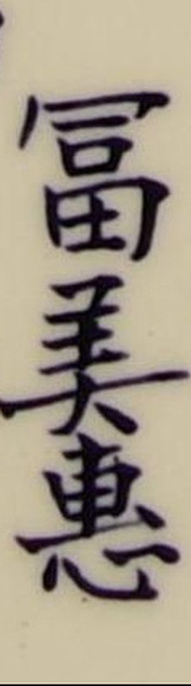冨美恵
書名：E~L
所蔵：高野山金剛峯寺
